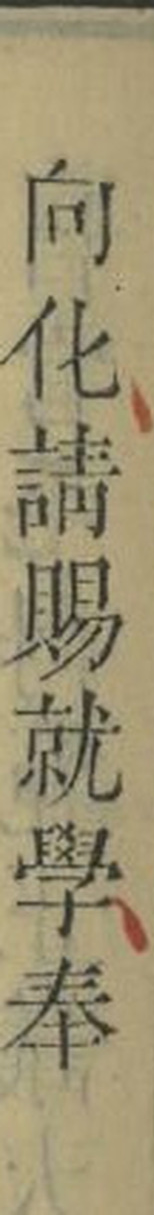向化請賜就学奉
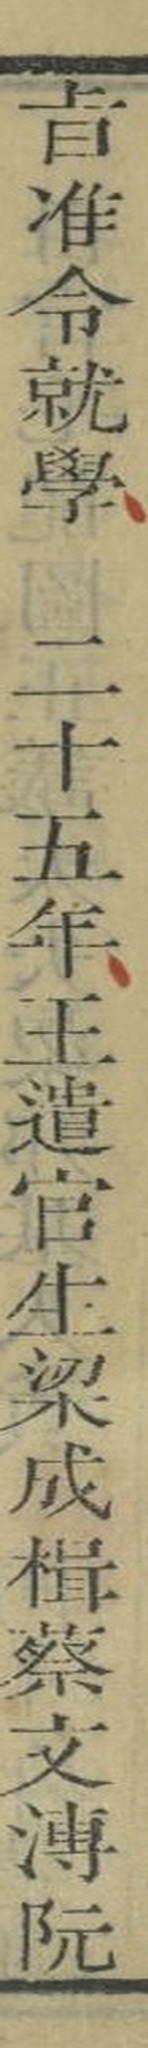旨准令就学二十五年王遣官生梁成楫蔡文溥阮
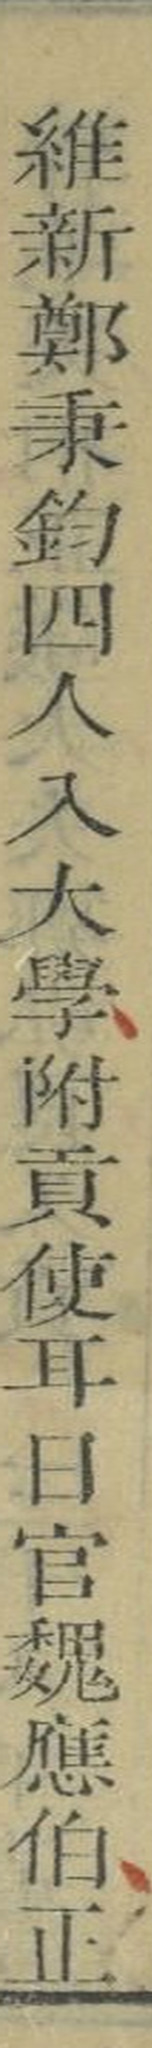維新鄭秉鈞四人入大学附貢使耳日官魏応伯正
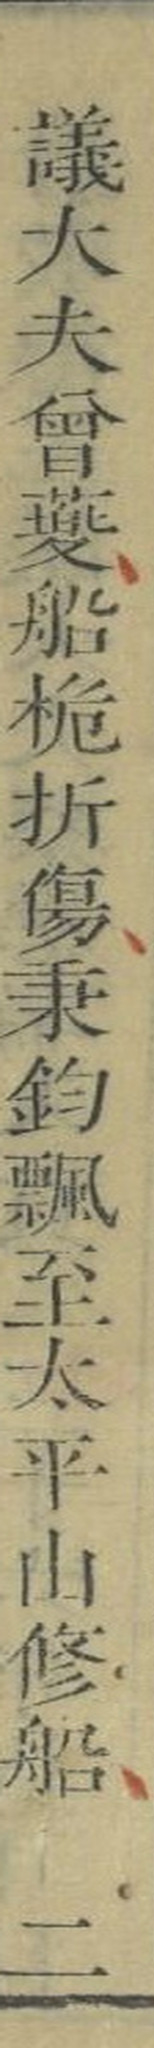議大夫曽䕫船桅折傷秉鈞飄至太平山修船二
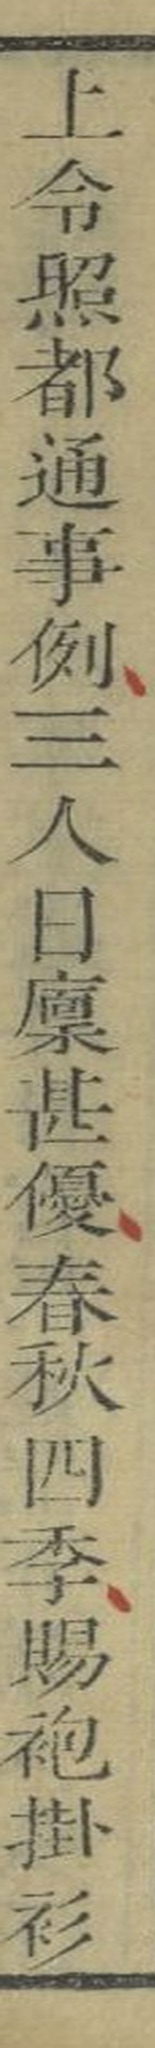上令照都通事例三人日廩甚優春秋四季賜袍掛衫
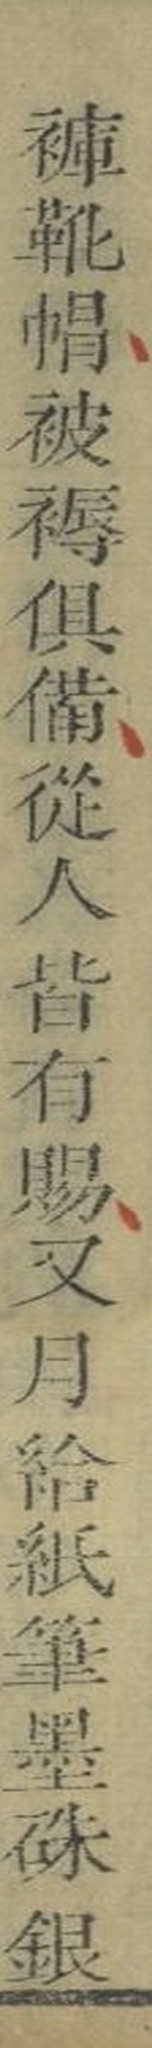褲靴帽被褥俱備従人皆有賜又月給紙筆墨硃銀
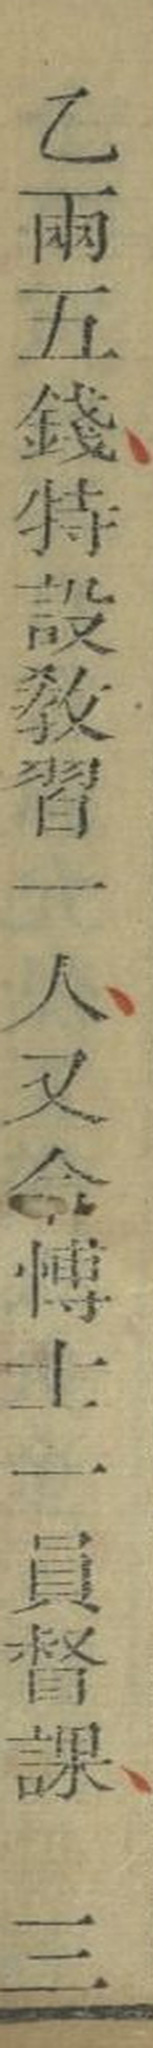乙両五銭特設教習一人又令博士一員督課三

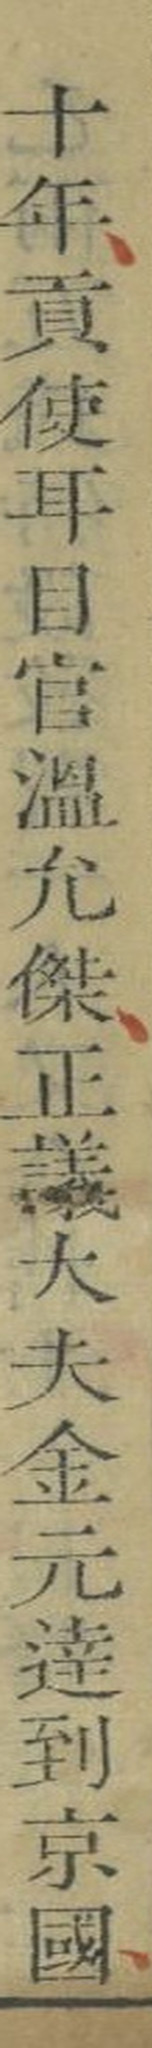十年貢使耳目官温允傑正議大夫金元達到京国
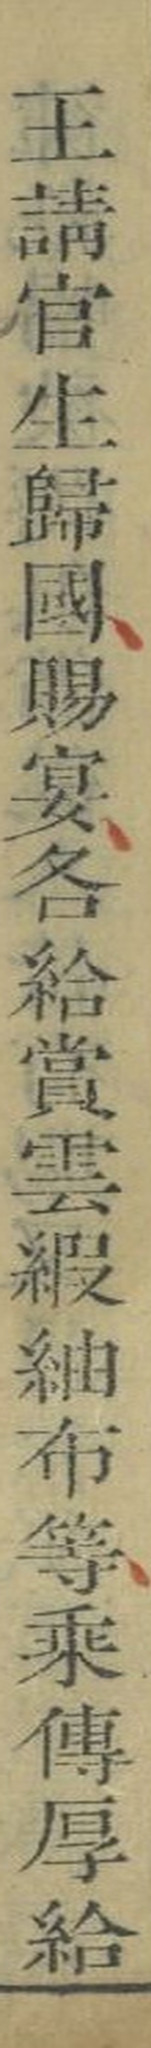王請官生帰国賜宴各給賞雲緞紬布等乗伝厚給
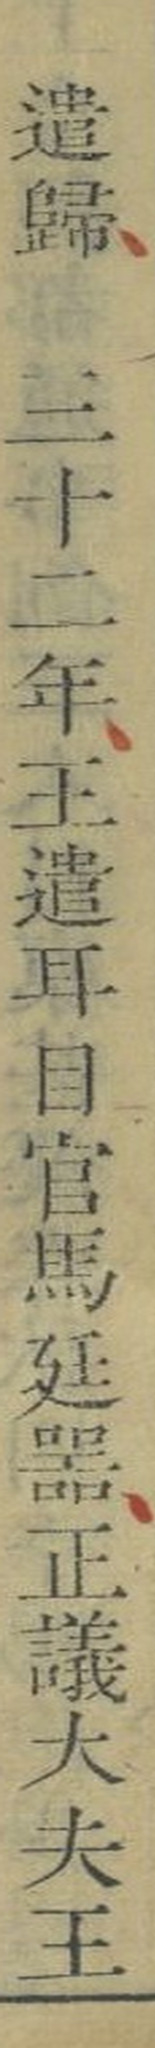遣帰三十二年王遣耳目官馬廷器正議大夫王
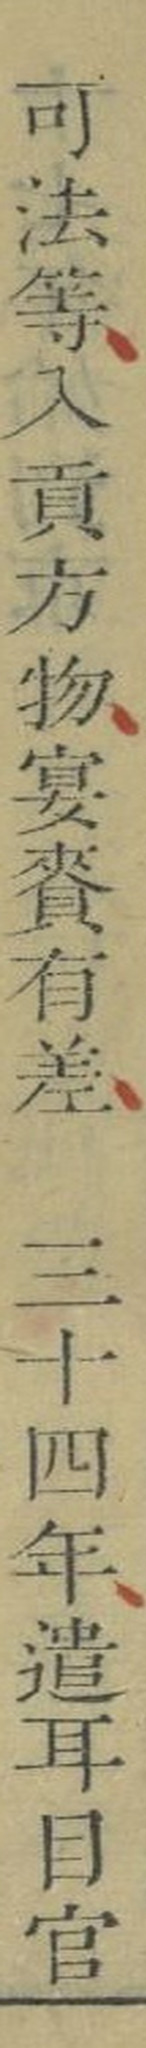可法等入貢方物宴賚有差三十四年遣耳目官
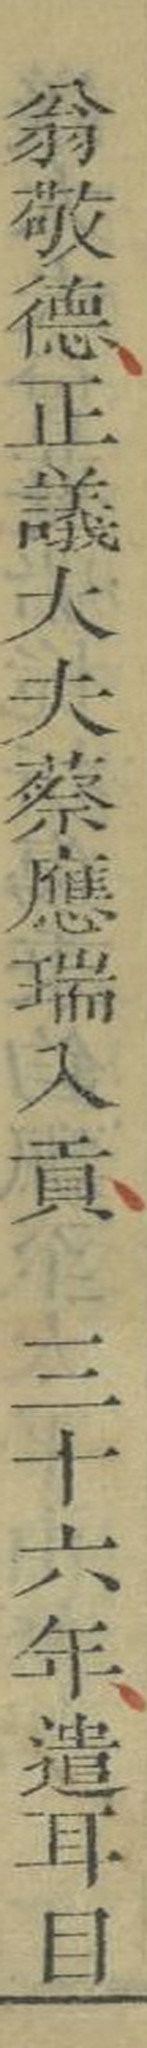翁敬徳正議大夫蔡応瑞入貢三十六年遣耳目
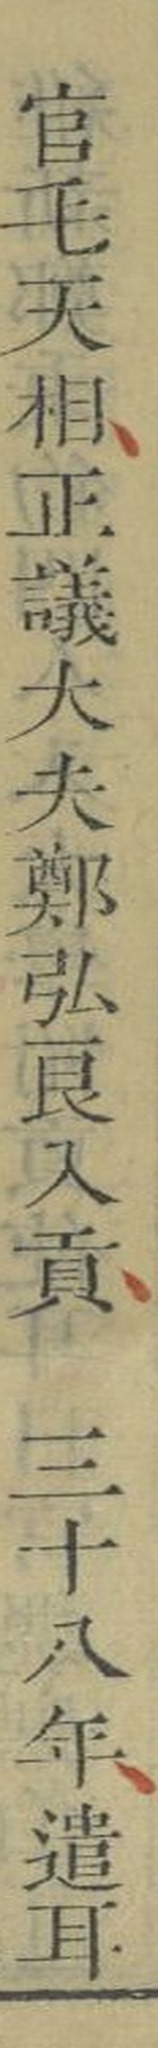官毛天相正議大夫鄭弘良入貢三十八年遣耳
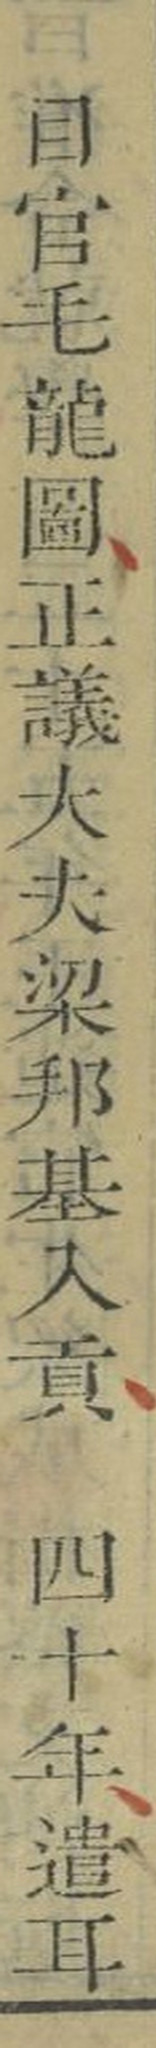目官毛竜図正議大夫梁邦基入貢四十年遣耳
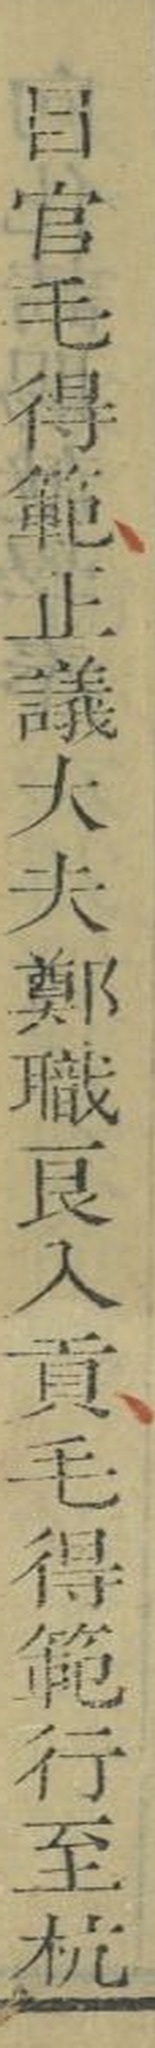目官毛得範正議大夫鄭職良入貢毛得範行至杭
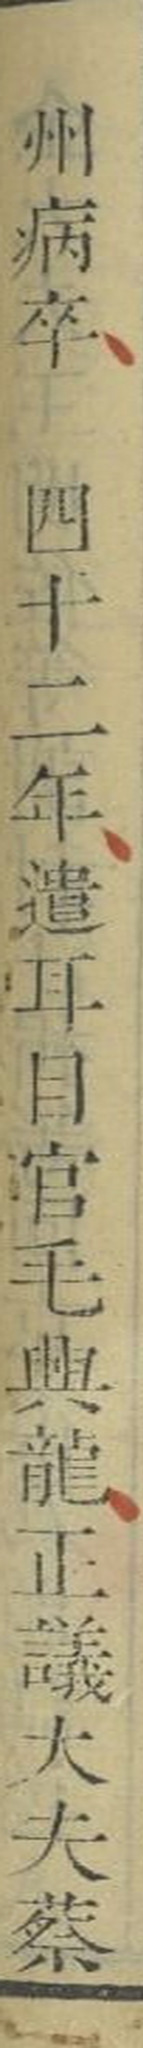州病卒四十二年遣耳目官毛興竜正議大夫蔡
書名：中山伝信録 巻三
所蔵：University of the Ryukyus Library
